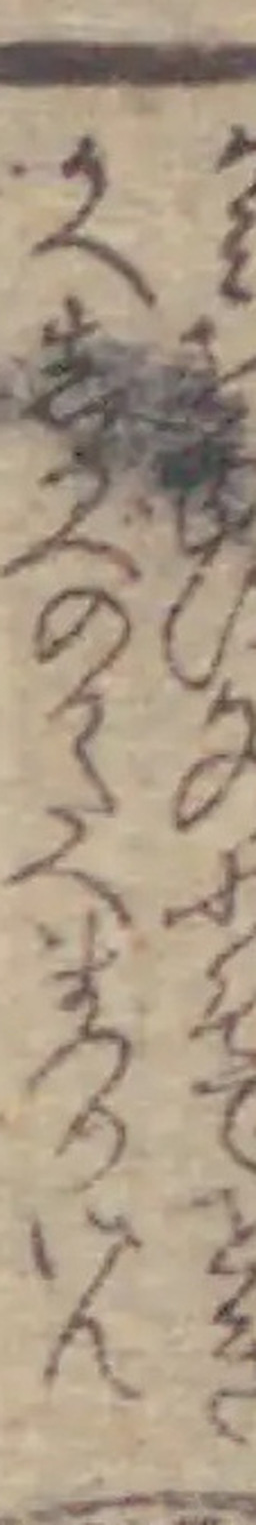かへしるべのかたへまつりけん
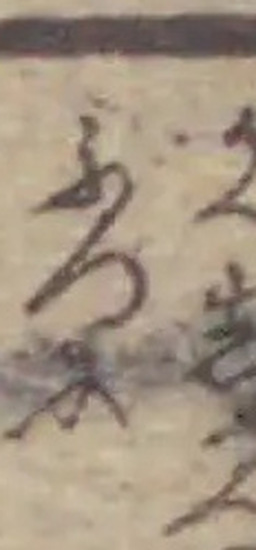ぶつに
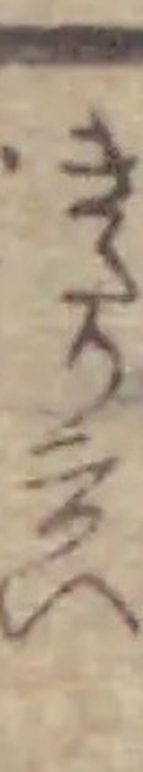きたり二かい
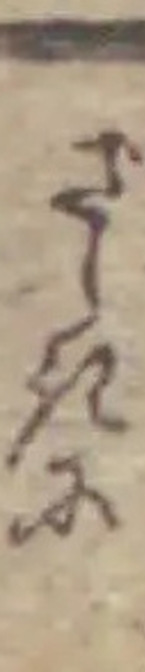ざしきに
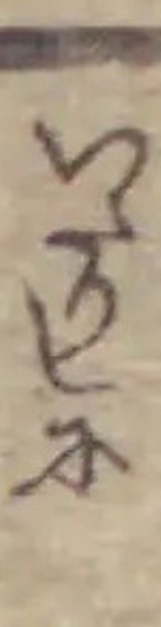いたりしに
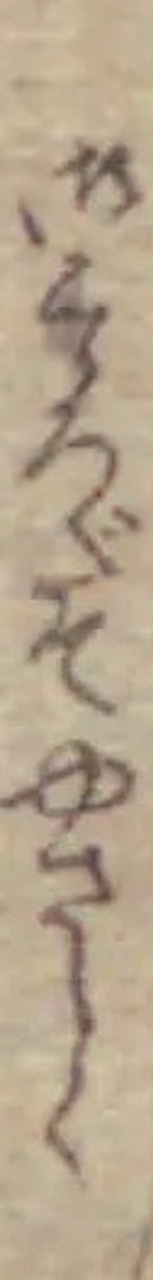御こゝろだてやさしく
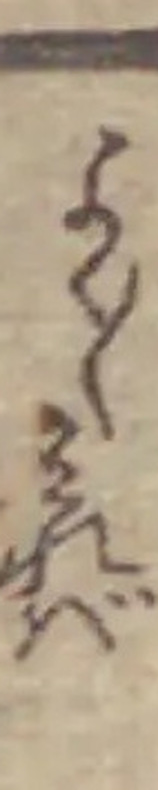よく〳〵みれば
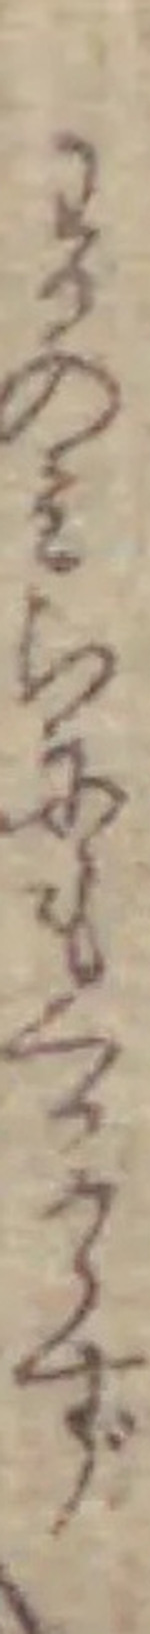わかのみちにもくらからず
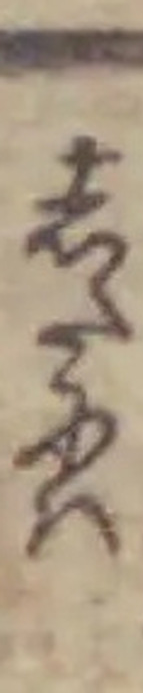したには
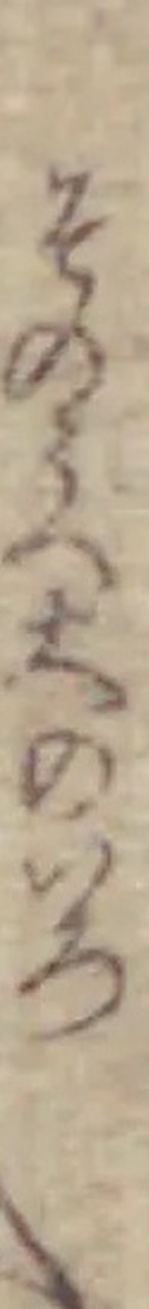そのうへ大のいろ
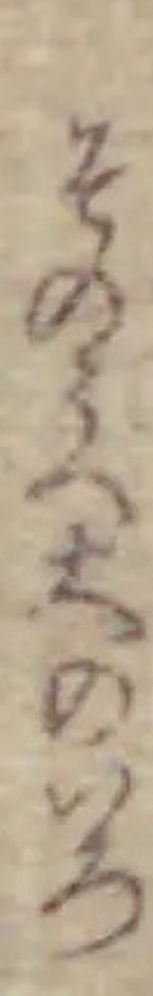そのうへ大のいろ
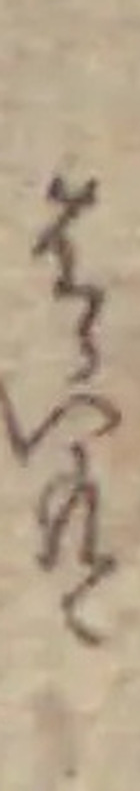はゝいもと
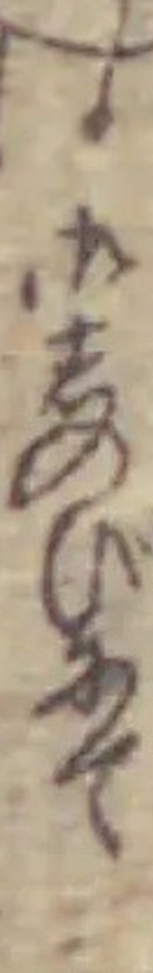御しのびにて
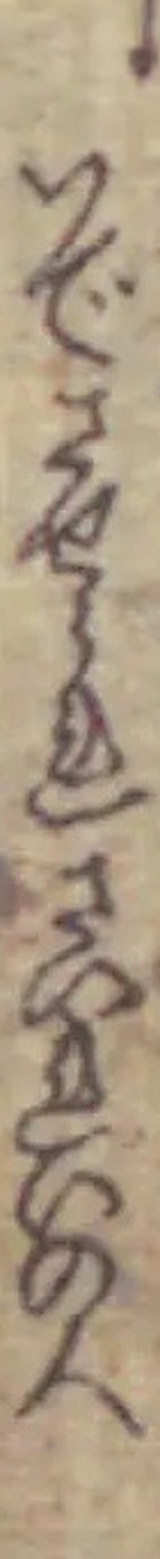いでさせられさいれいの人
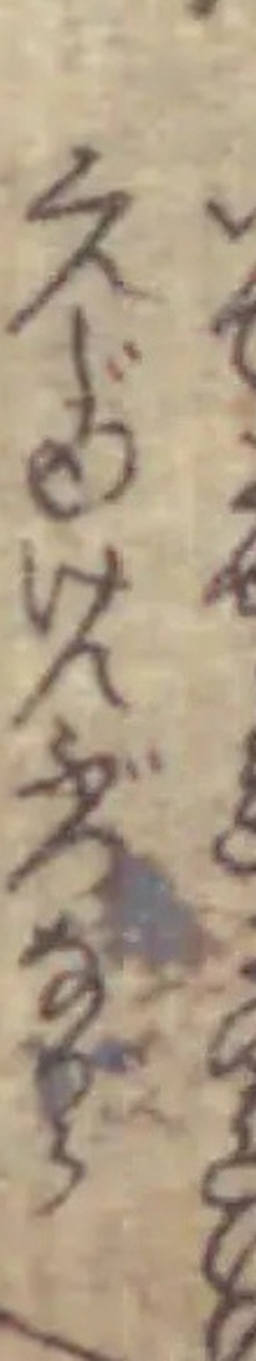くんじゆけんぶつながら
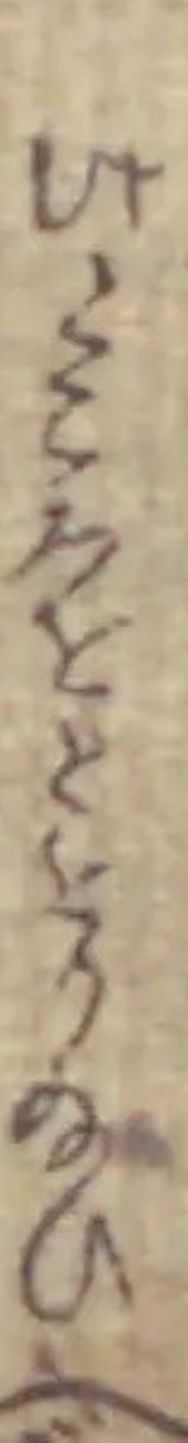此ところをとをり給ひ
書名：奥州咄 3巻
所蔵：国立国会図書館 National Diet Library, JAPAN
